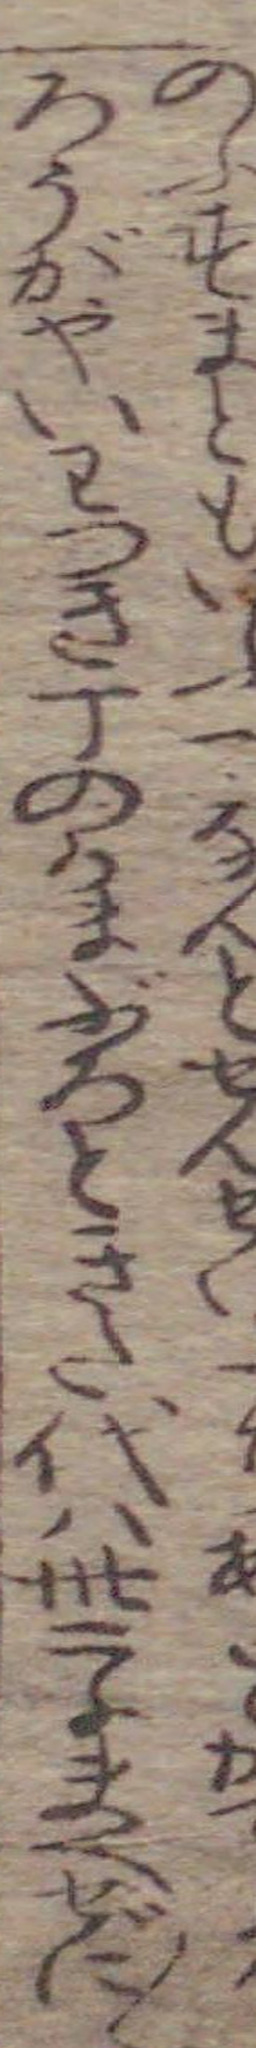ろうがやいわつき丁のかまぶろときた代は卅まへぜに〳〵

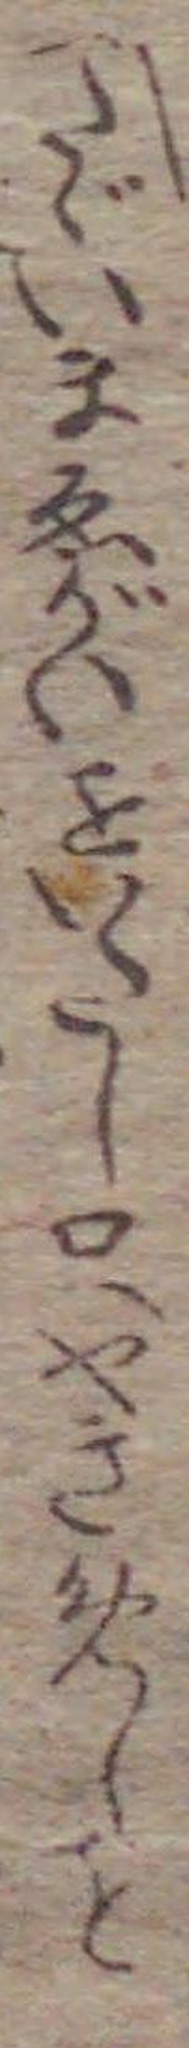〽たゞいまゑがいをいたし口へやきめしを
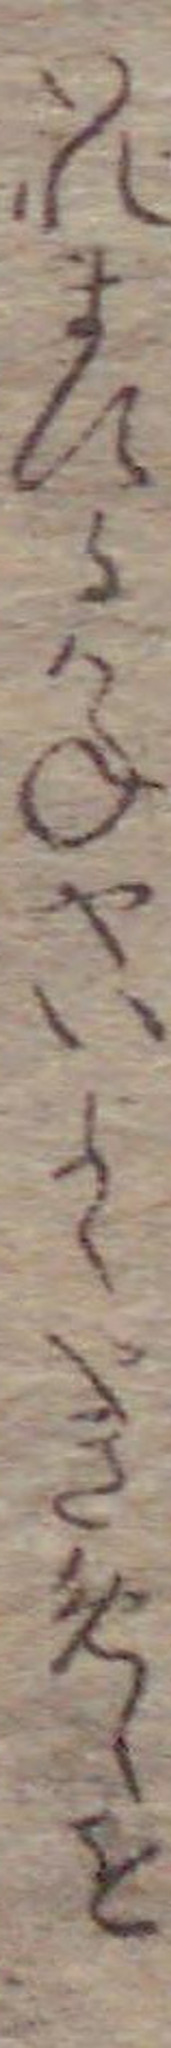いれまするかねやいよくやきめしを
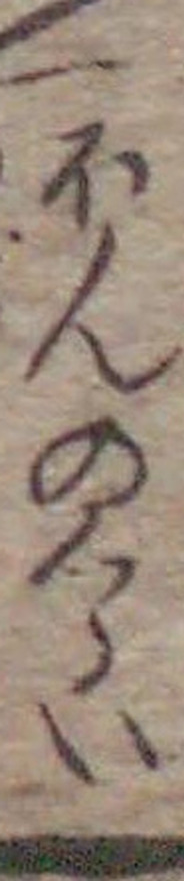ほんのくらい
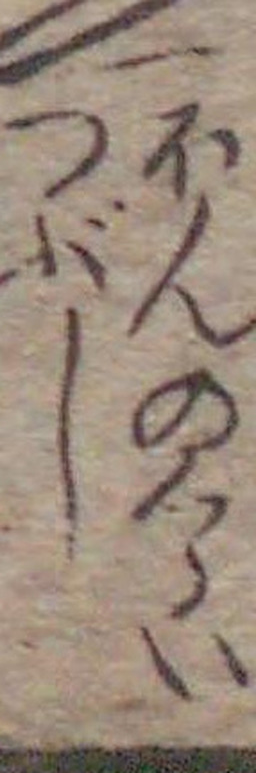つぶし
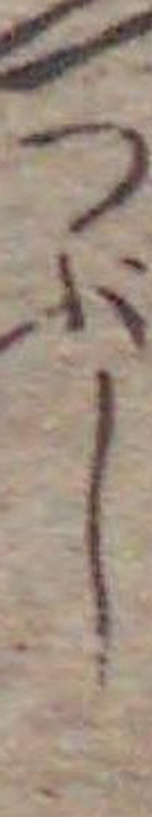つぶし
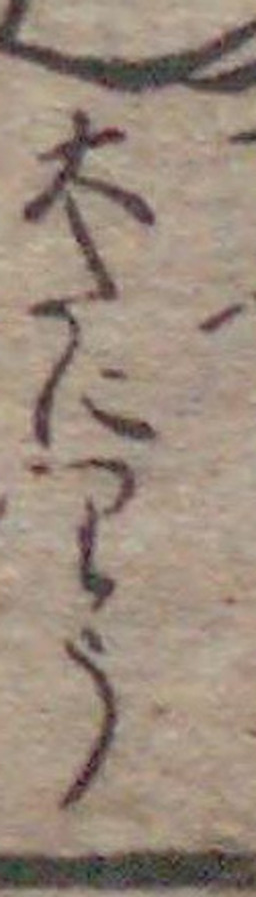大たにりう
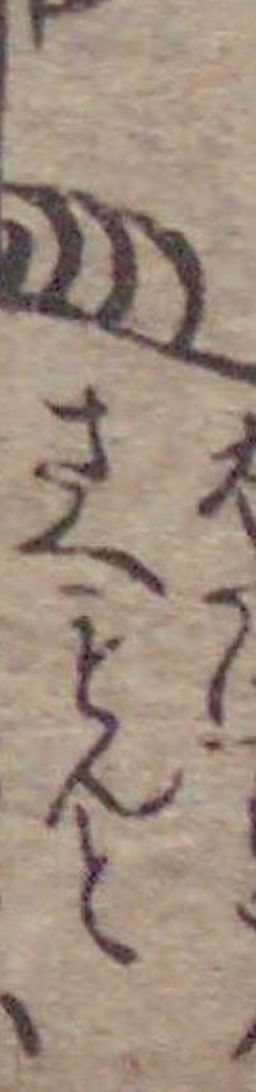さへもんと
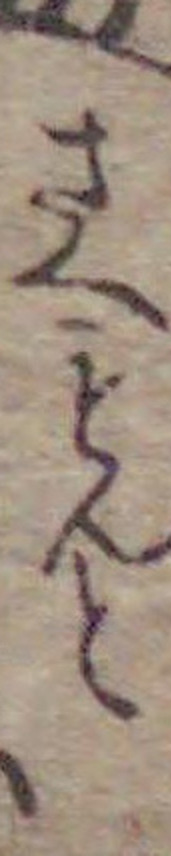さへもんと
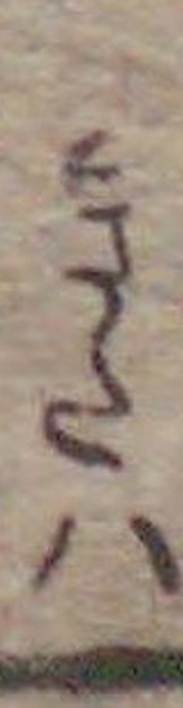きたは
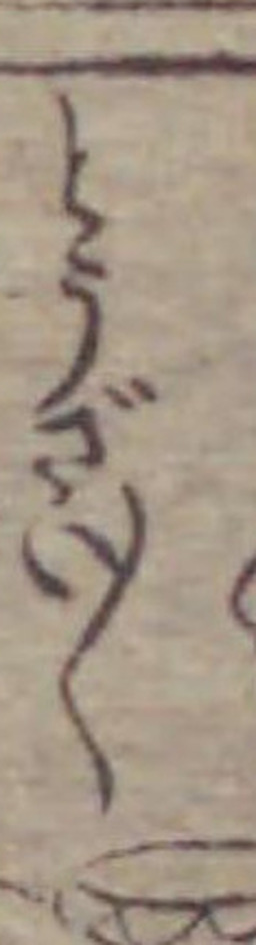とうざい〳〵
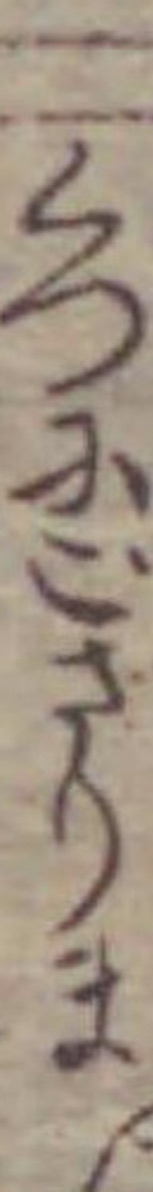くつにござりま
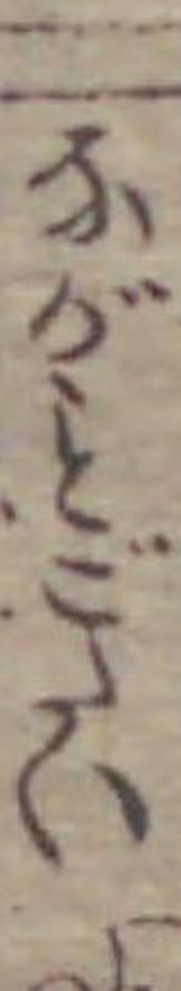ながことごたい
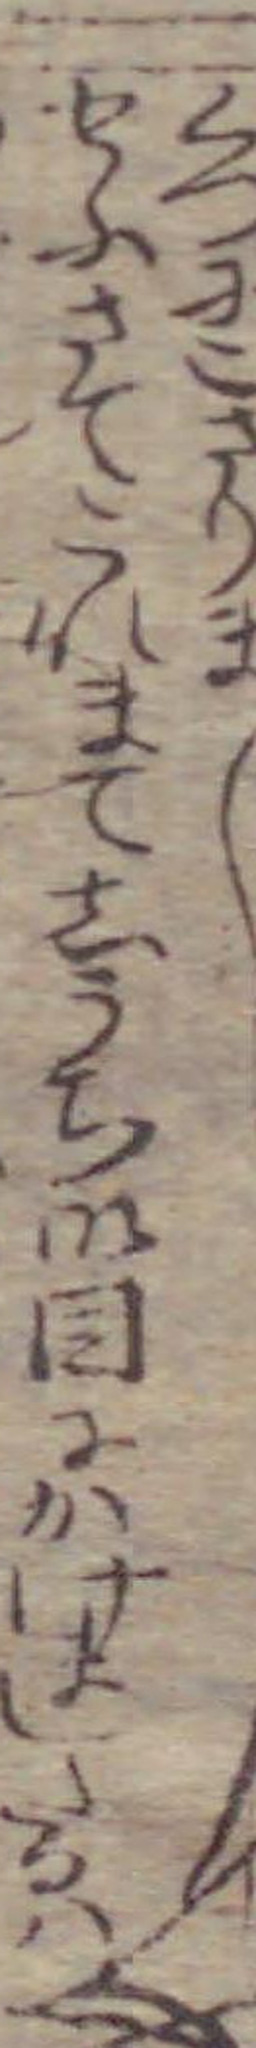せふさてこれまてしうち御目にかけましたるは
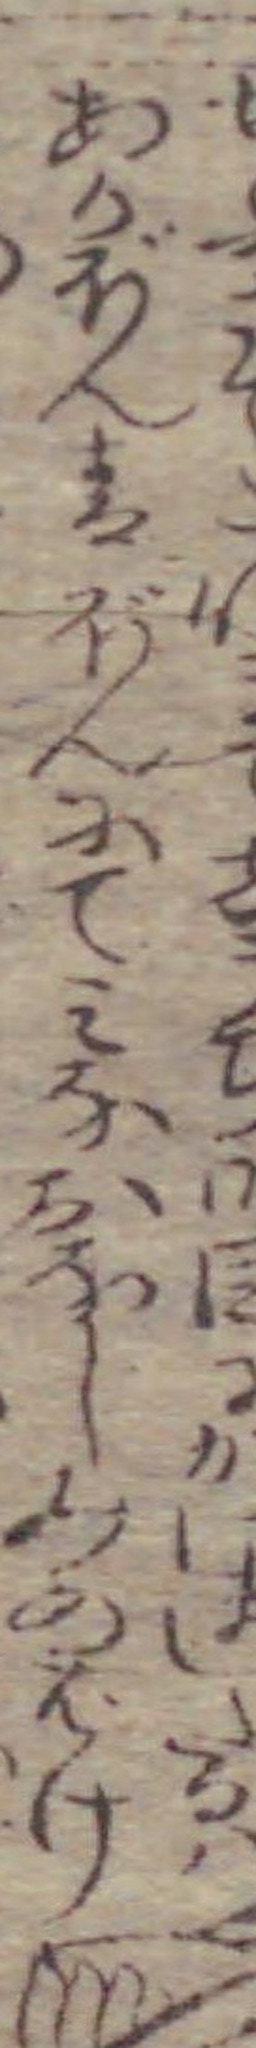あかぼん壹ぼんにてみなおなしみのばけ
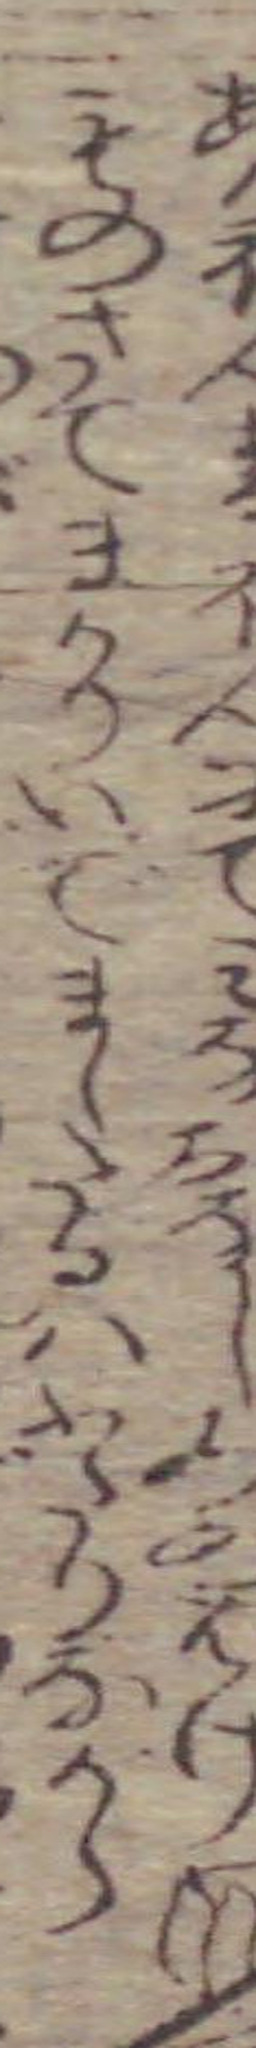ものさてまかりいでましたるはふたりなから
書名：妖怪仕内評判記 : 2巻
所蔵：国立国会図書館 National Diet Library, JAPAN
